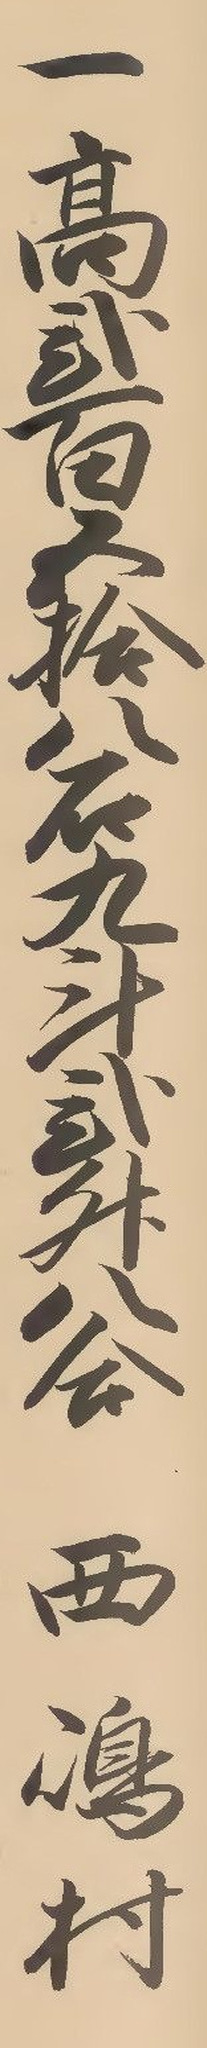一高弐百五拾八石九斗弐升八合西島村
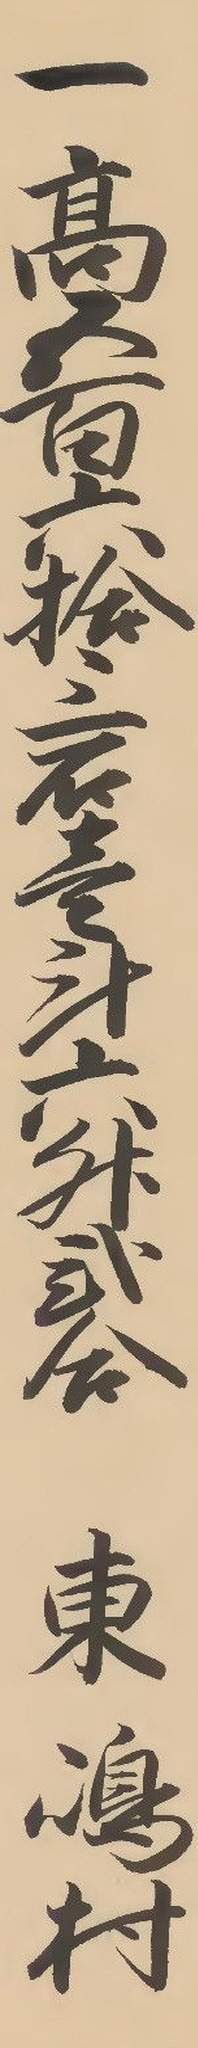一高五百六拾三石壱斗六升弐合東島村
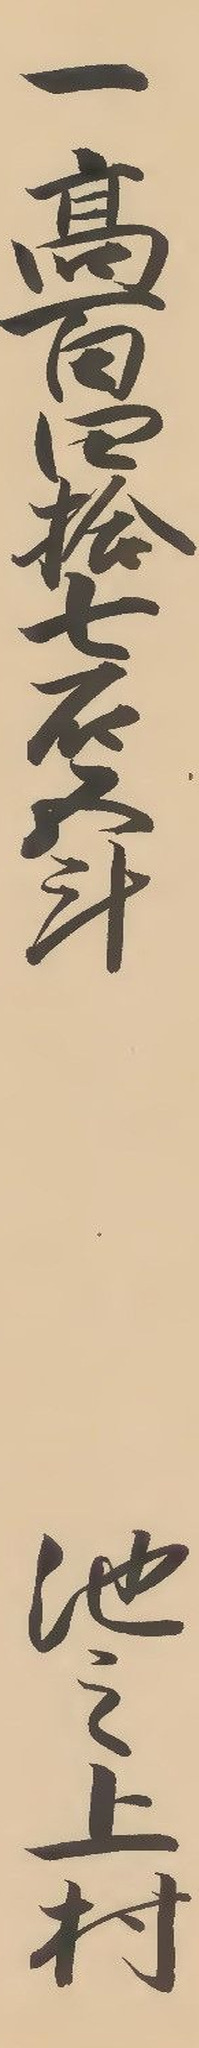一高百四拾七石五斗池之上村
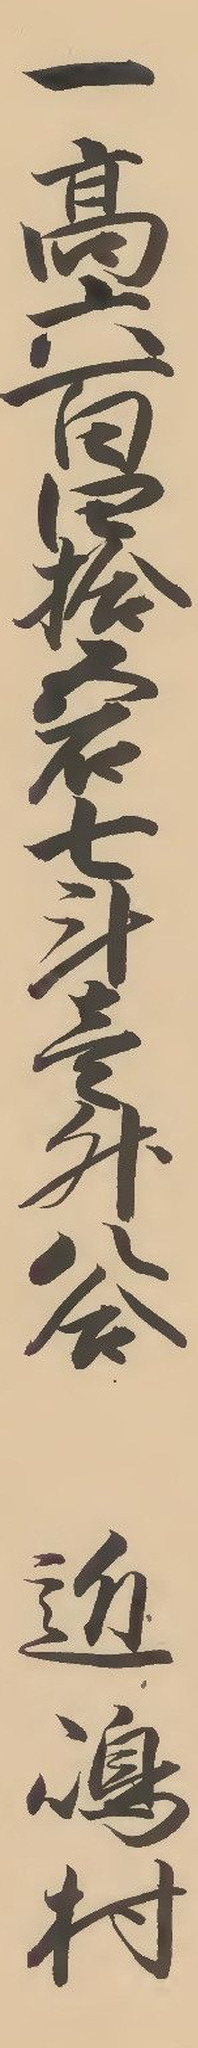一高六百四拾五石七斗壱升八合近島村

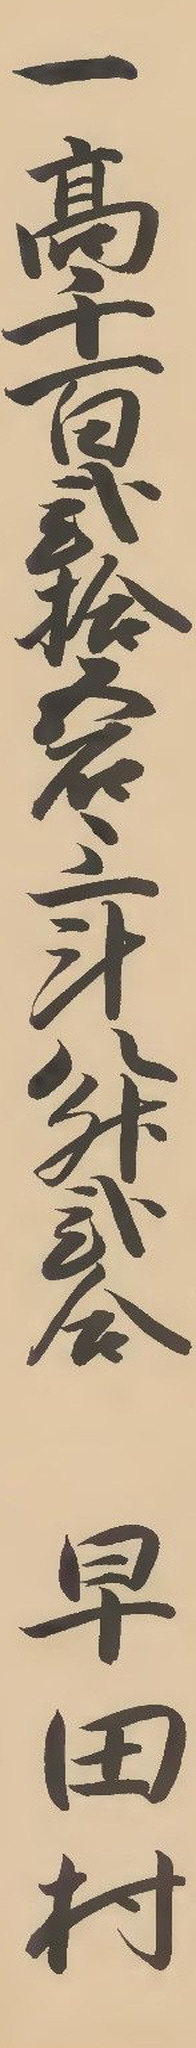一高千百弐拾五石三斗八升弐合早田村
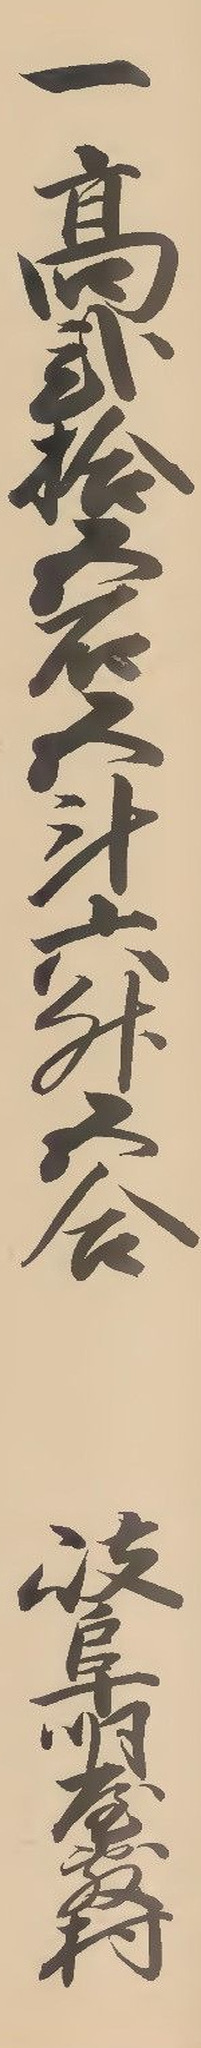一高弐拾五石五斗六升五合岐阜明屋敷村
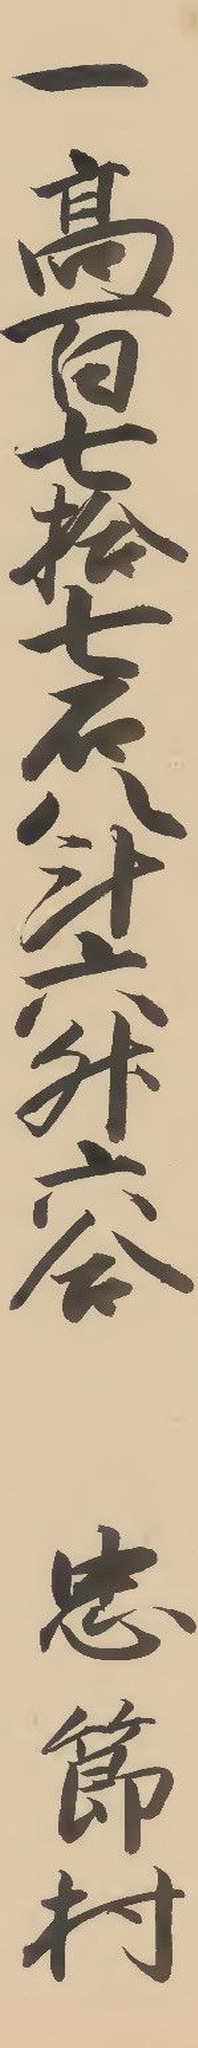一高百七拾七石八斗六升六合忠節村
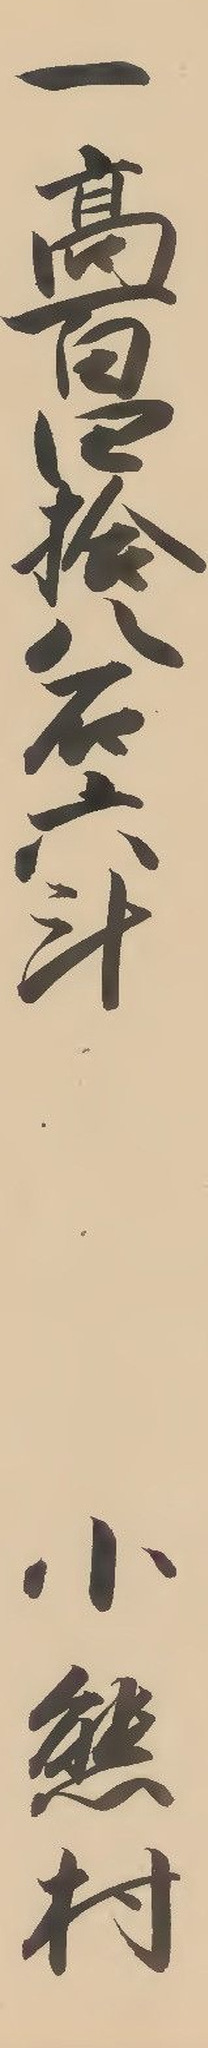一高百四拾八石六斗小熊村
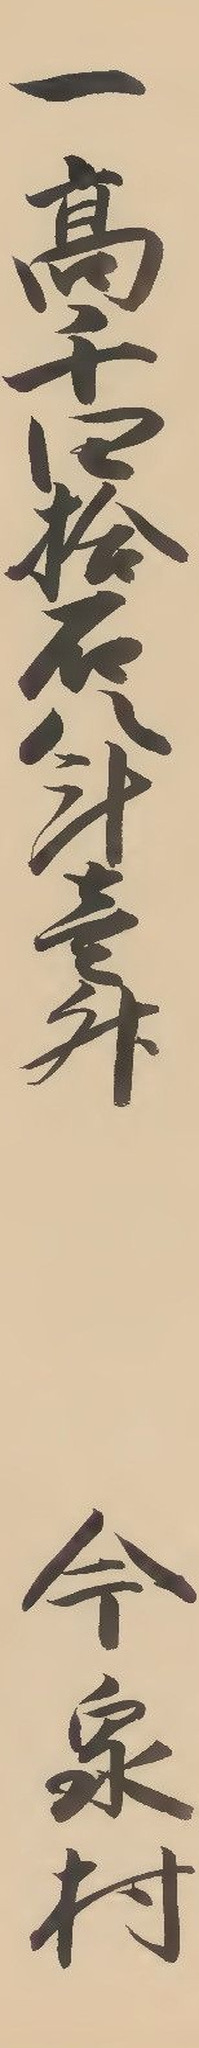一高千四拾石八斗壱升今泉村

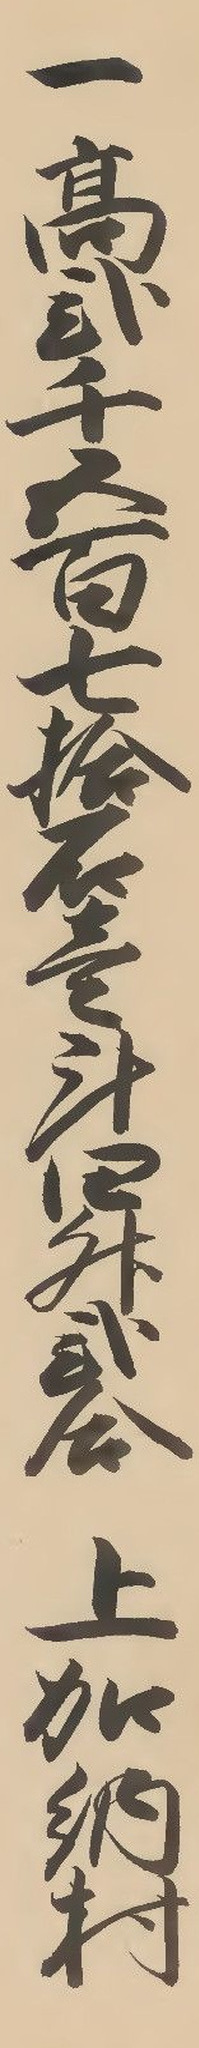一高弐千五百七拾石壱斗四升弐合上加納村
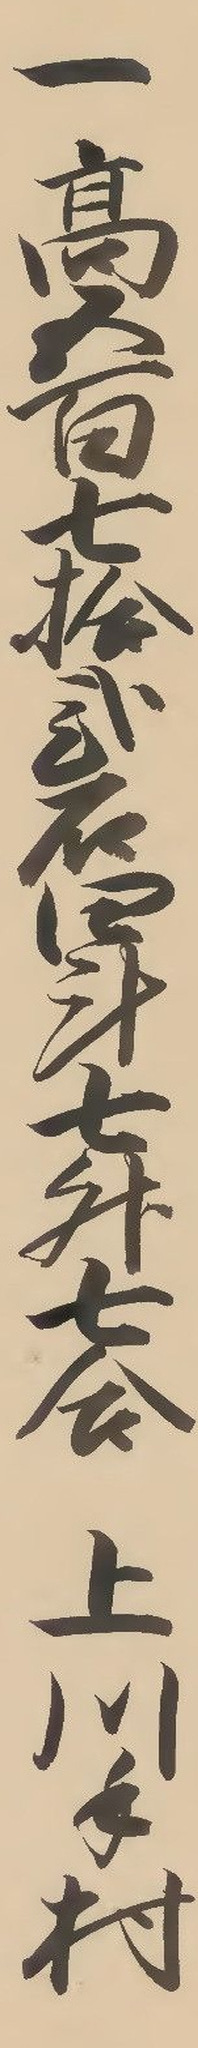一高五百七拾弐石四斗七升七合上川手村
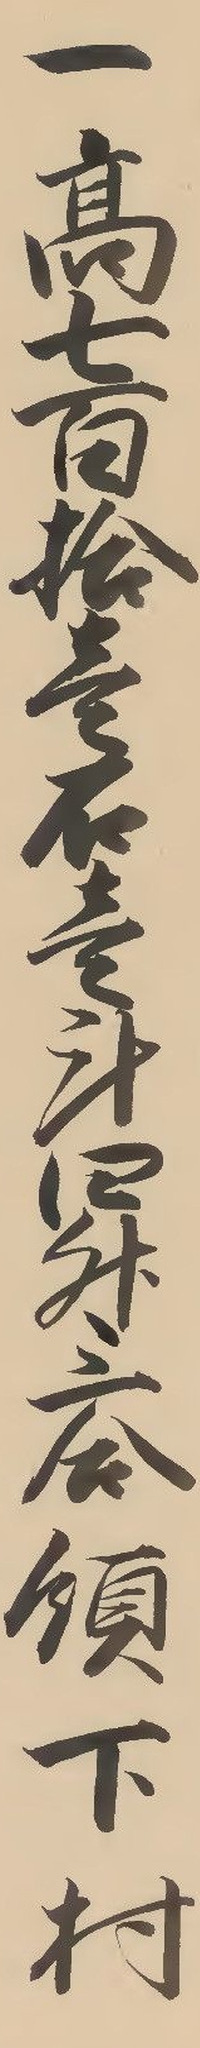一高七百拾壱石壱斗四升三合領下村
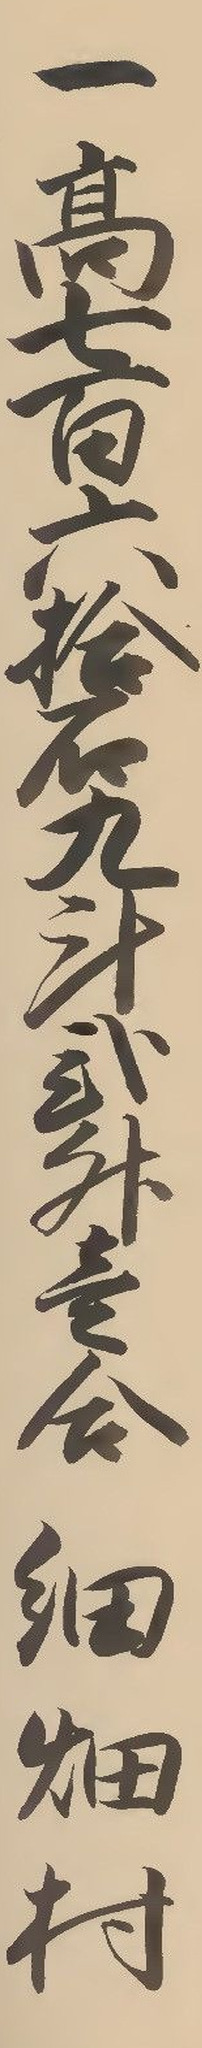一高七百六拾石九斗弐升壱合細畑村
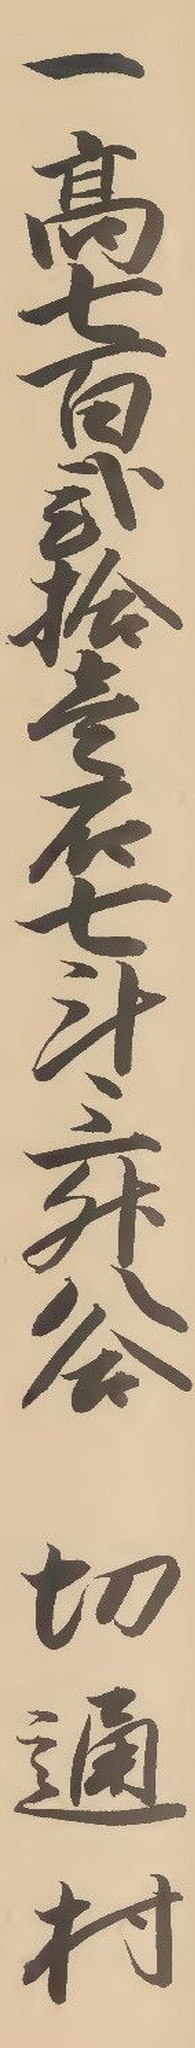一高七百弐拾壱石七斗三升八合切通村
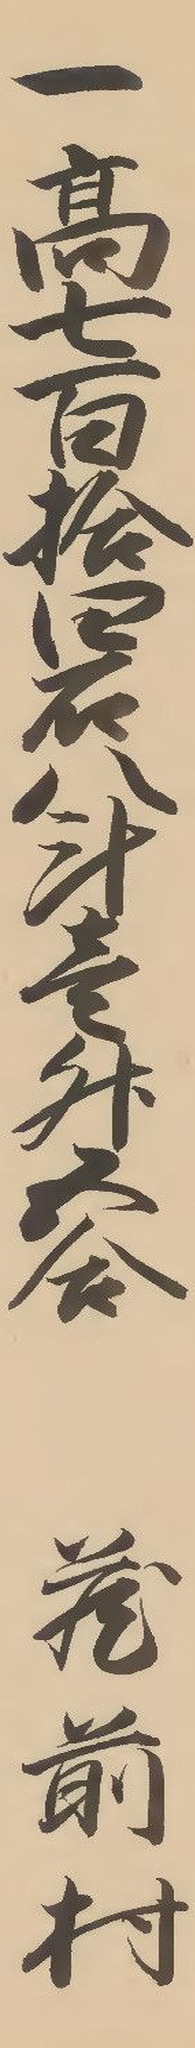一高七百拾四石八斗壱升五合蔵前村
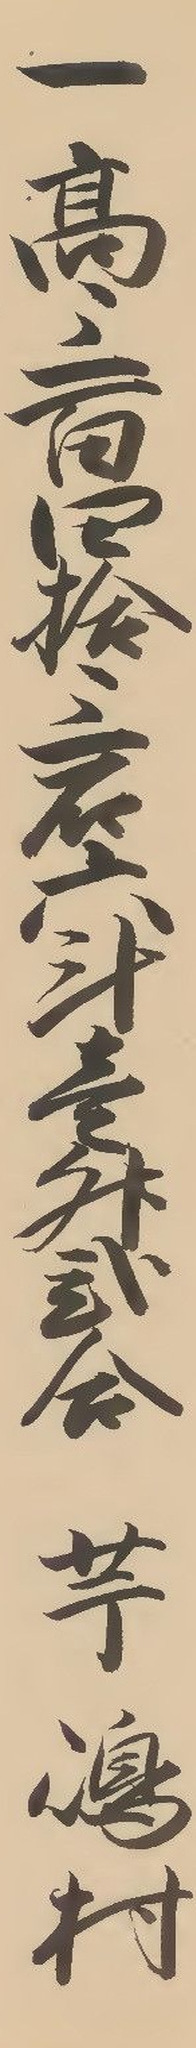一高三百四拾三石六斗壱升弐合芋島村
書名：美濃国郷帳
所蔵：国立公文書館 National Archives of Japan
